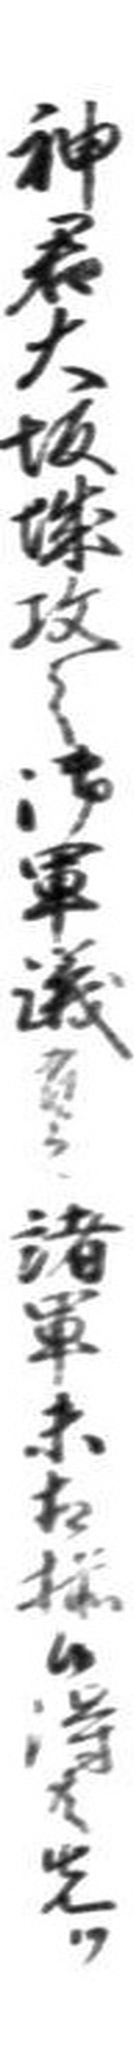神君大坂城攻之御軍議有之諸軍未相揃候得共先ツ
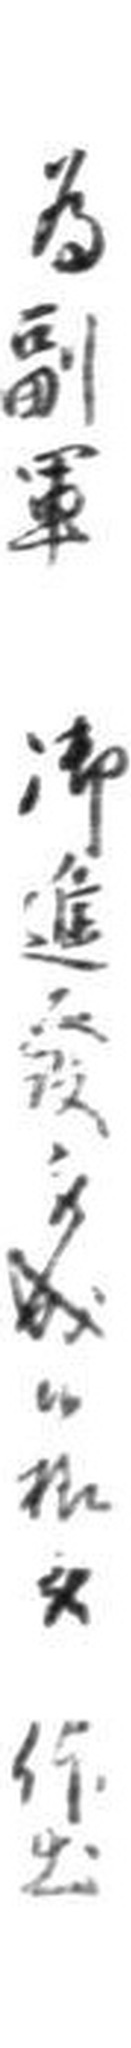為副軍御進発被成候様被仰出
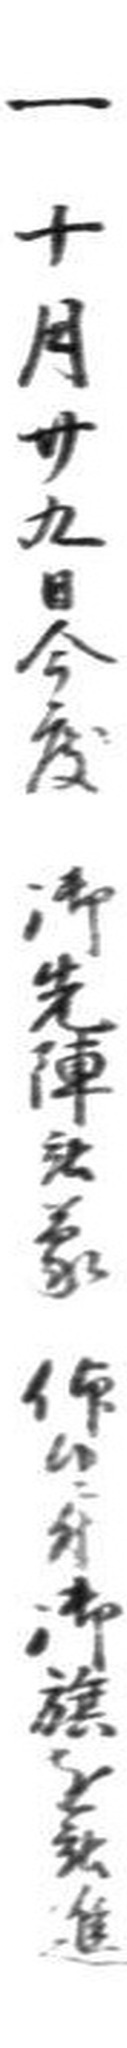一十月廿九日今度御先陣被蒙仰候ニ付御旗を被進
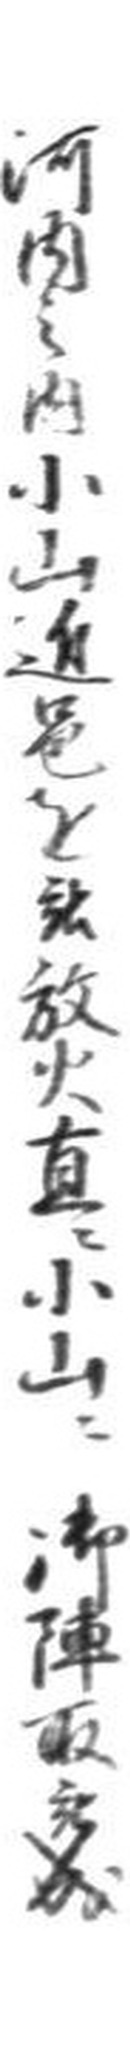河内之内小山近邑を被放火直ニ小山ニ御陣取被成
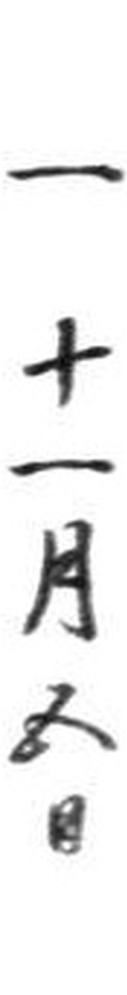一十一月五日

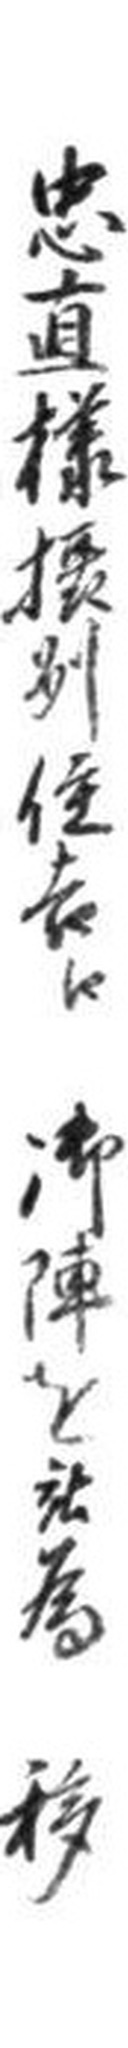忠直様摂州住吉江御陣を被為移
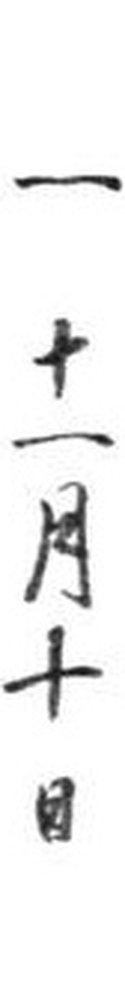一十一月十日
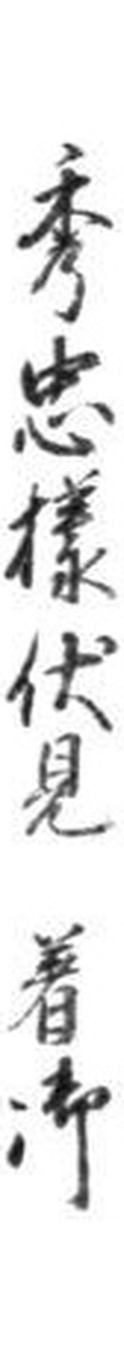秀忠様伏見着御
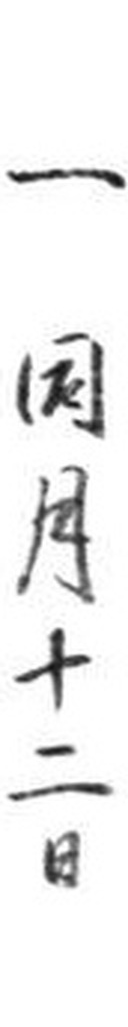一同月十二日
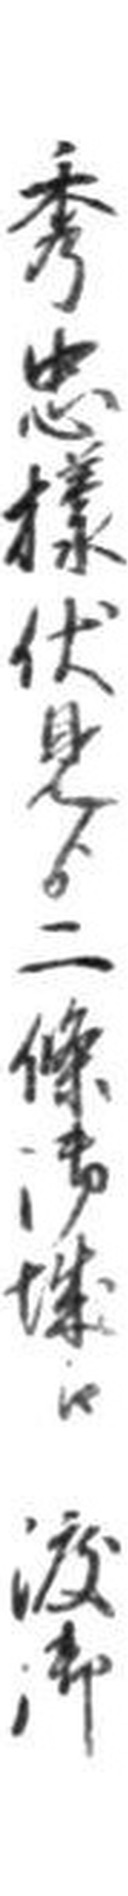秀忠様伏見ゟ二條御城江渡御
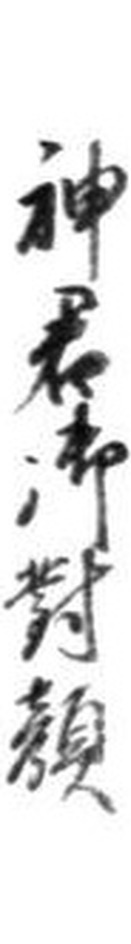神君御対顔
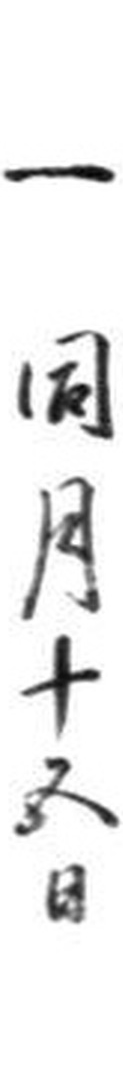一同月十五日
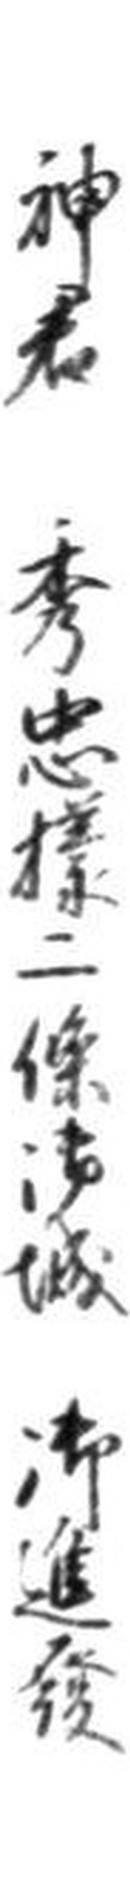神君秀忠様二條御城御進発
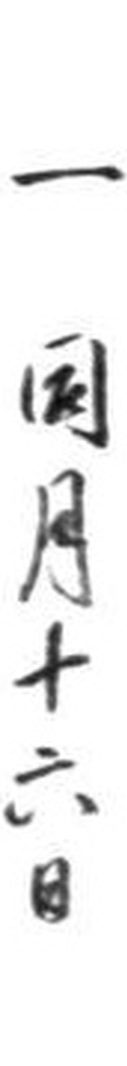一同月十六日
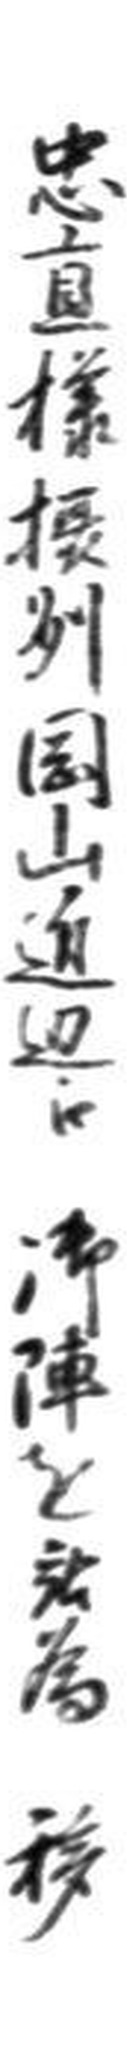忠直様摂州岡山近辺江御陣を被為移
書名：家譜 二 忠直公 従文禄四年到慶安四年
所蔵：福井県文書館 Fukui Prefectural Archives
